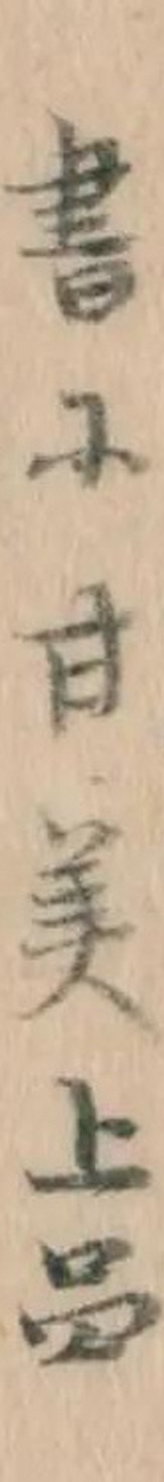書に甘美上品
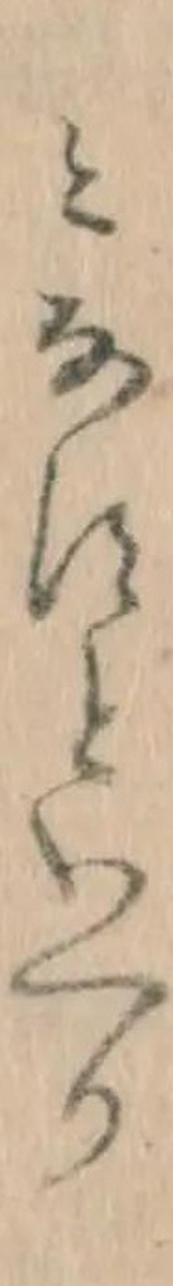となすといへり
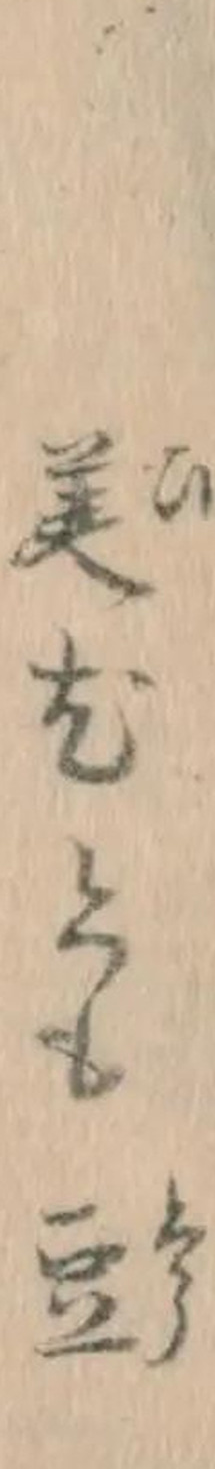美尤とも豆
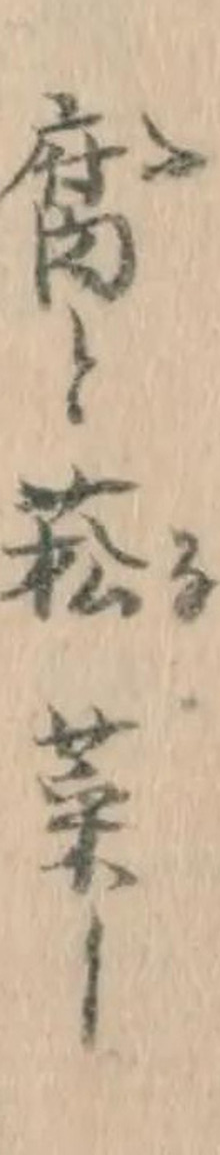腐と菘菜し
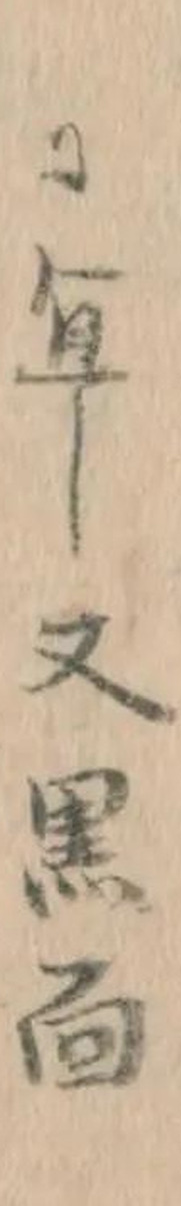に宜し又黒面
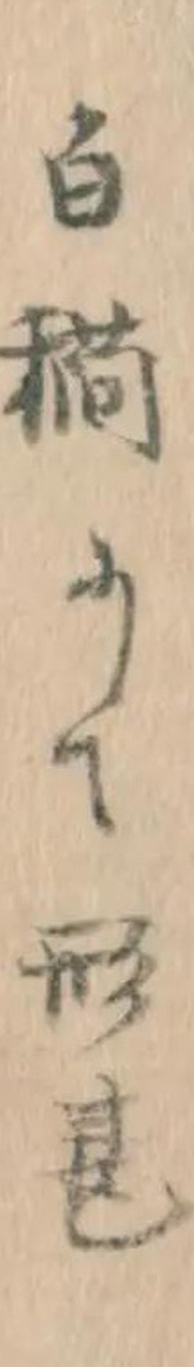白にして形甚
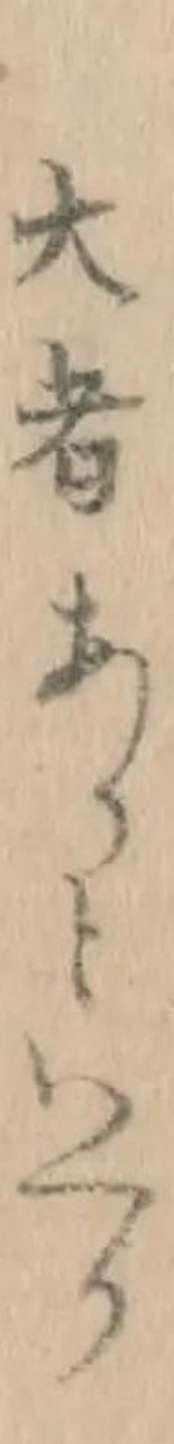大者ありといへり

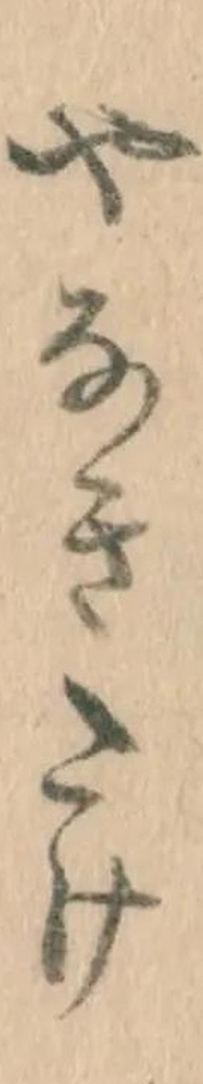やなきたけ
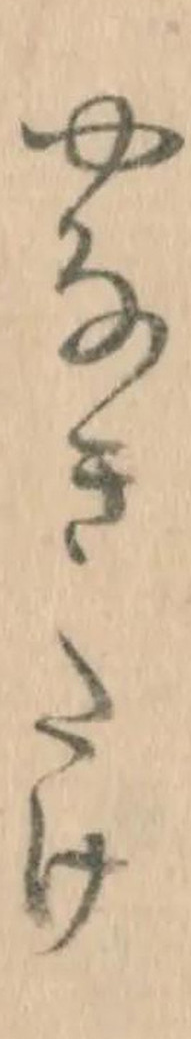やなきたけ
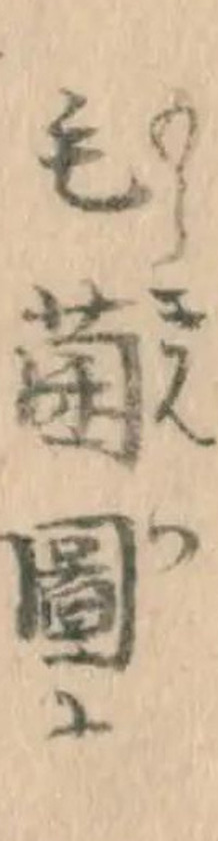毛菌図に
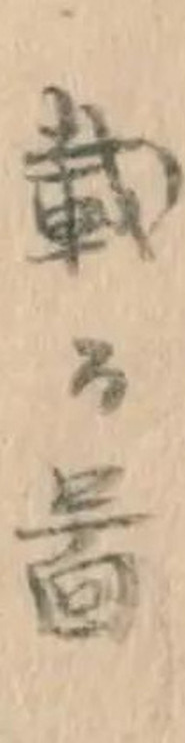載る図
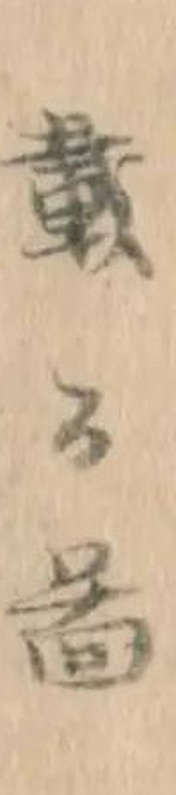載る図
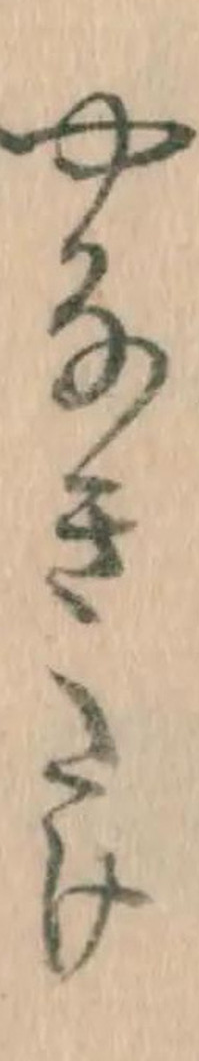やなきたけ
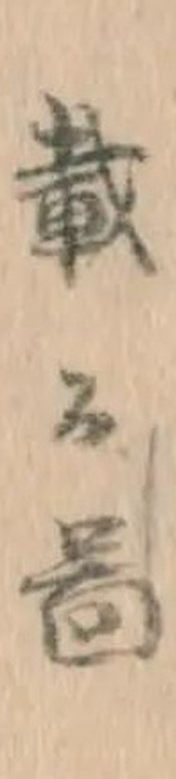載る図
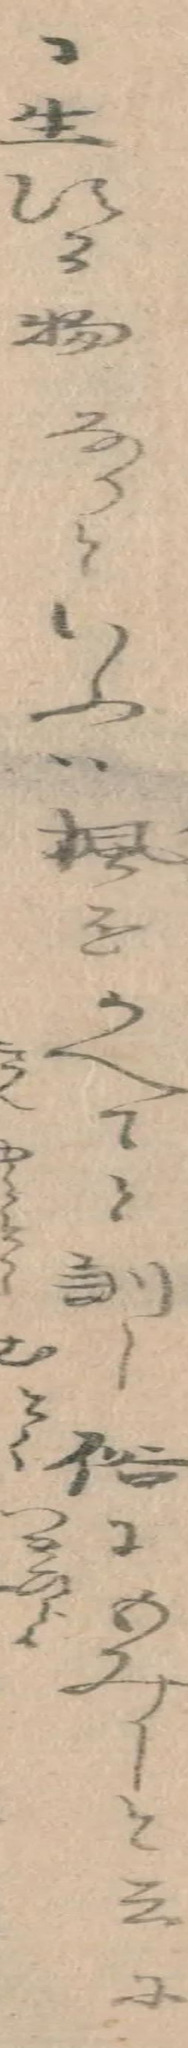に生する物なりといふは楓をかへてと訓し俗にもみしと云に
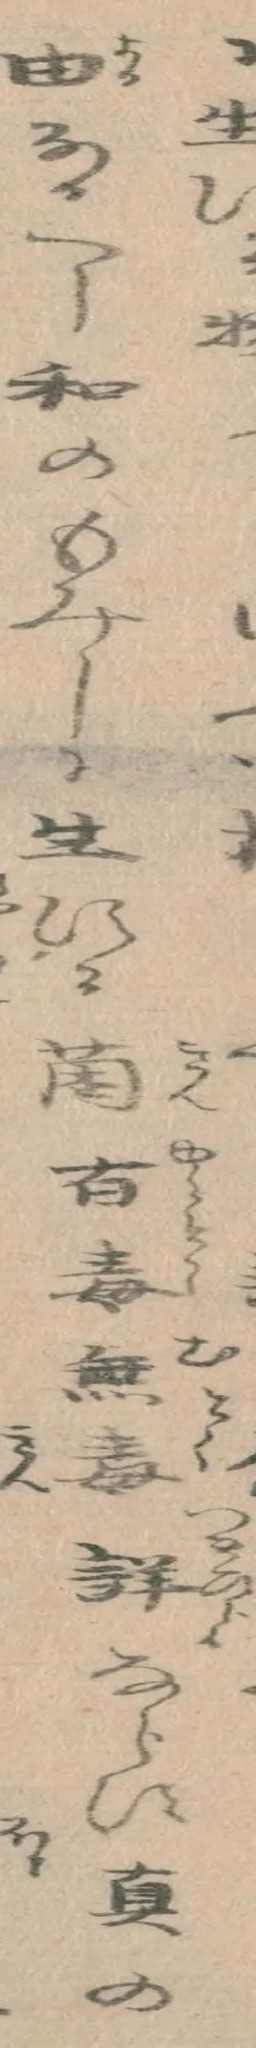由なるへし和のもみしに生する菌有毒無毒詳ならす真の
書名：本草図譜. 巻55-57
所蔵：国立国会図書館 National Diet Library, JAPAN
